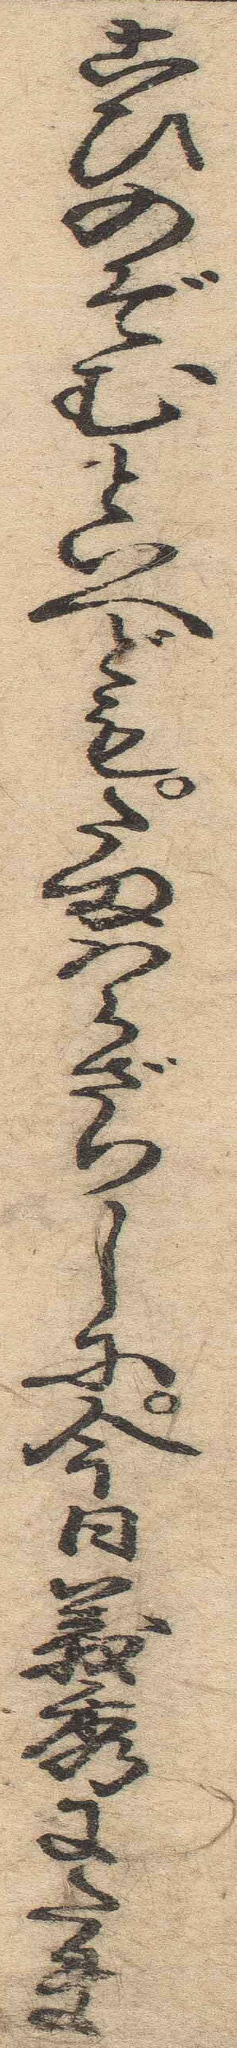こひのぞむといへども。たまはらざりしに。今日義秀にたま
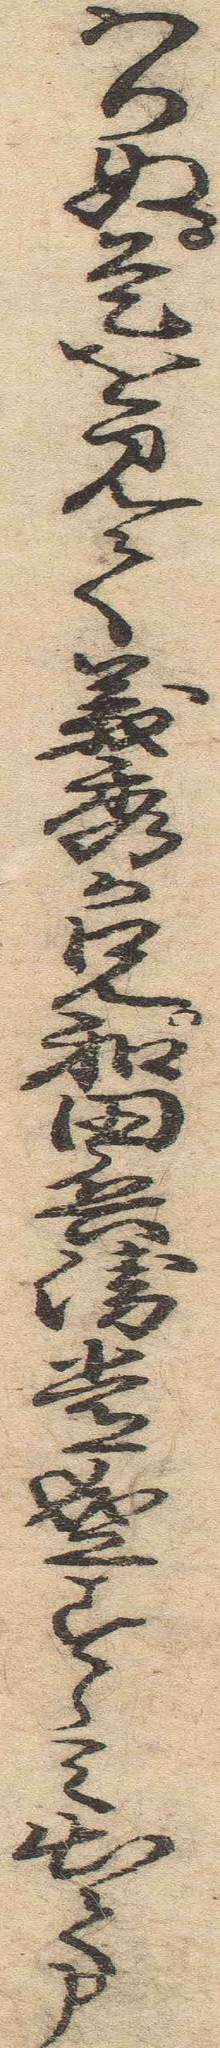はりぬ。是を見て義秀か兄和田兵衛常盛すゝみ出て申
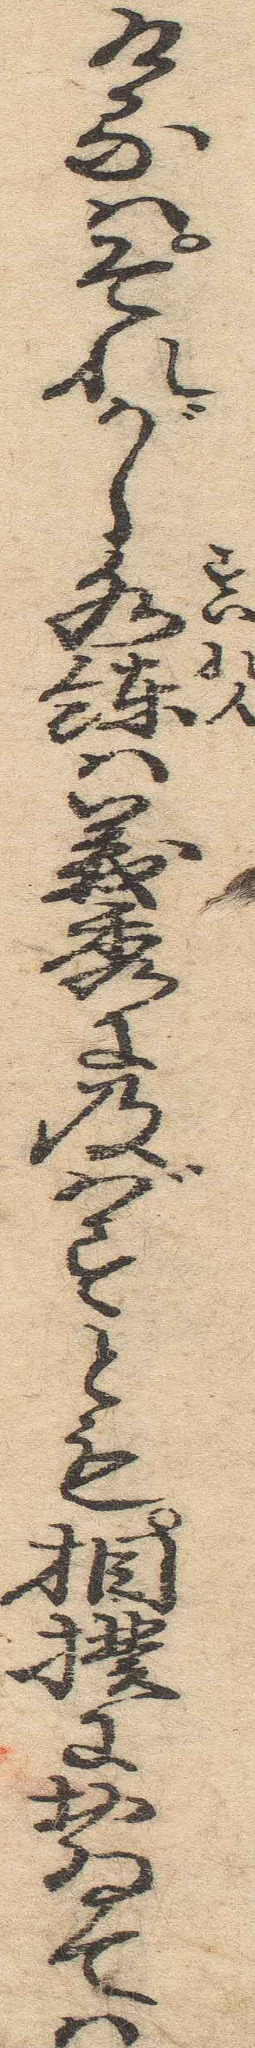けるは。それがし水練は義秀に及ずばとも相撲におゐては
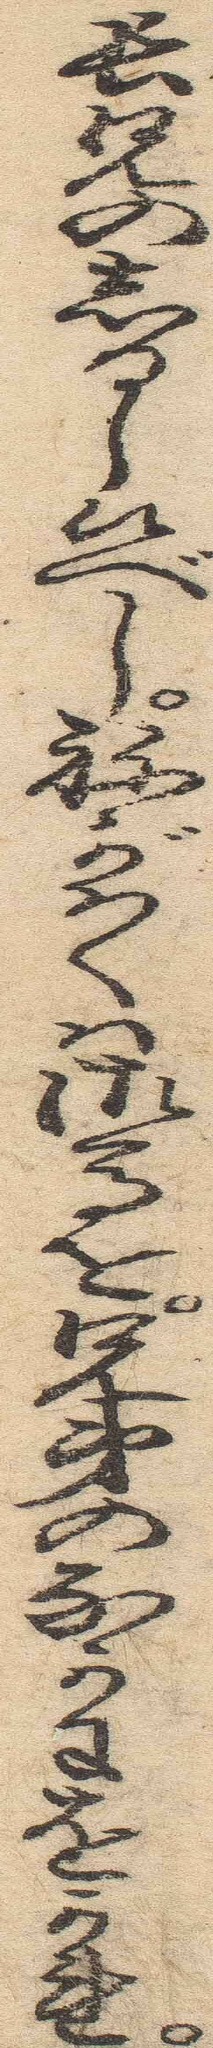長兄のしるし候べし。ねがはくは御馬を兄弟のなかにをかれ。
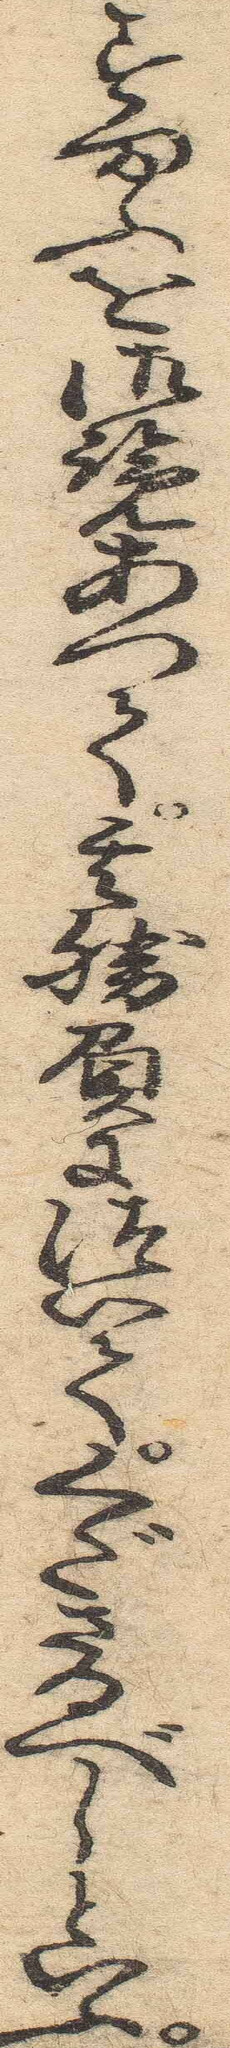すまふを御覧あつて。其勝負について。くださるべしといふ。
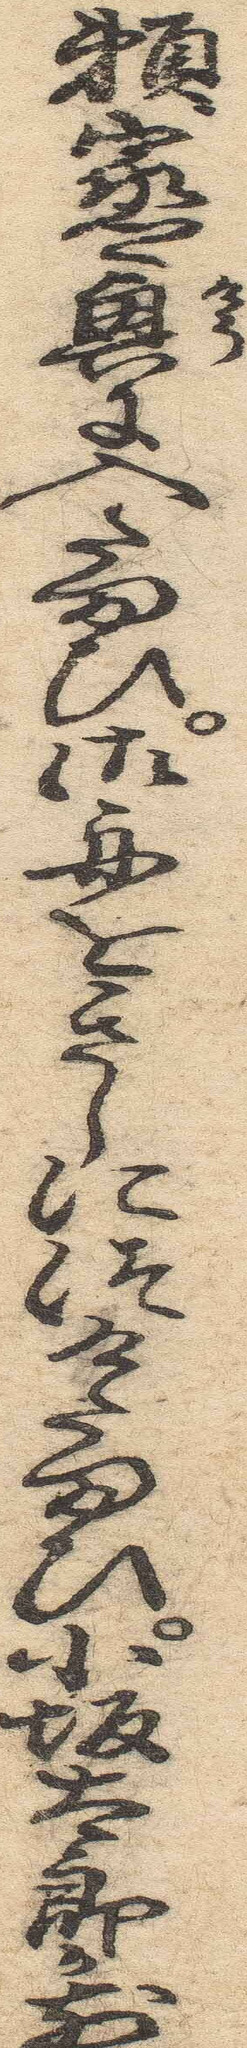頼家卿興に入たまひ。御舟をきしにつけたまひ。小坂太郎か前
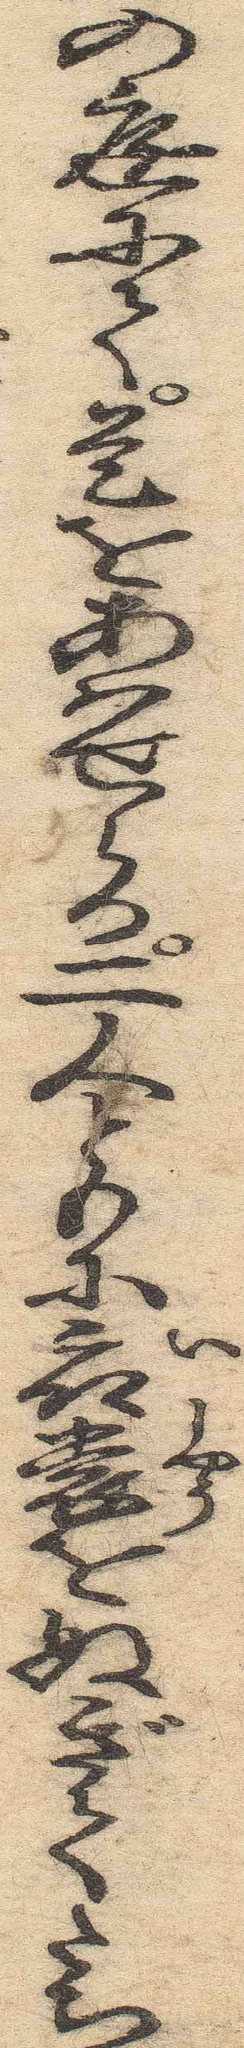の庭にて。是をあはせたり。二人ともに衣装ぬぎてたち
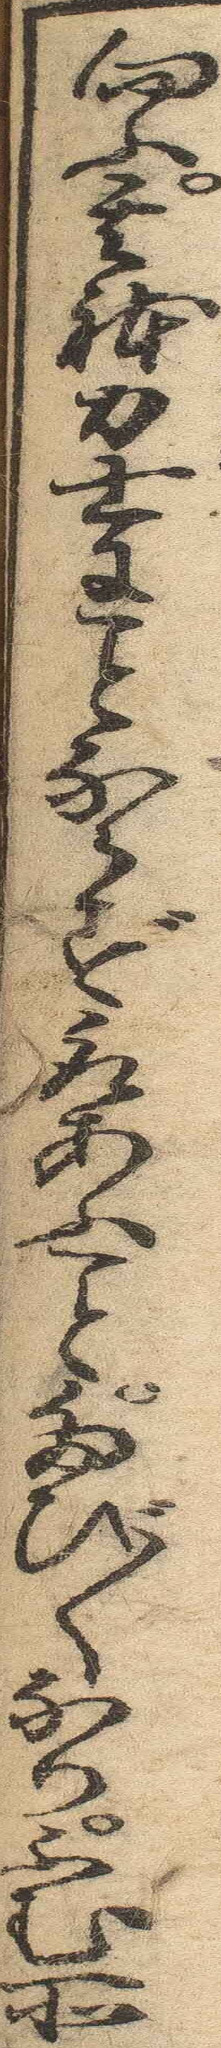向ふ。其体力士にことならず取あふこと。たび〳〵なり。ふむ所
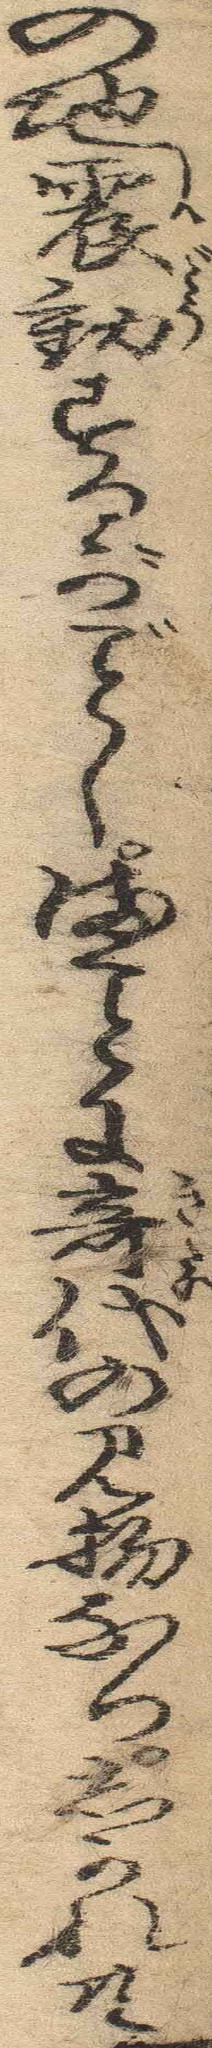の地震動するがごとし。まことに希代の見物なり。しかれ共
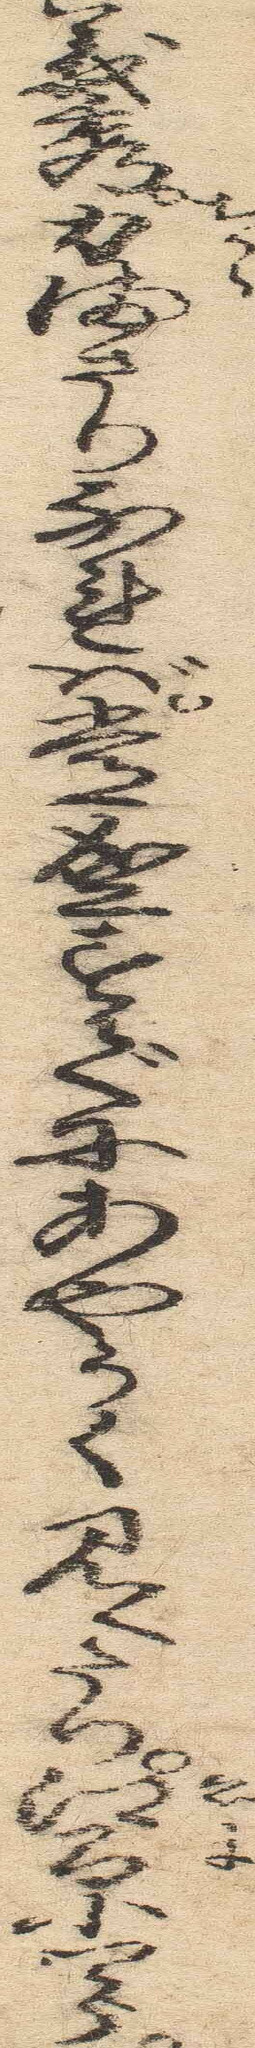義秀力まさりなれば。常盛あやうく見へたり。江間小四郎。
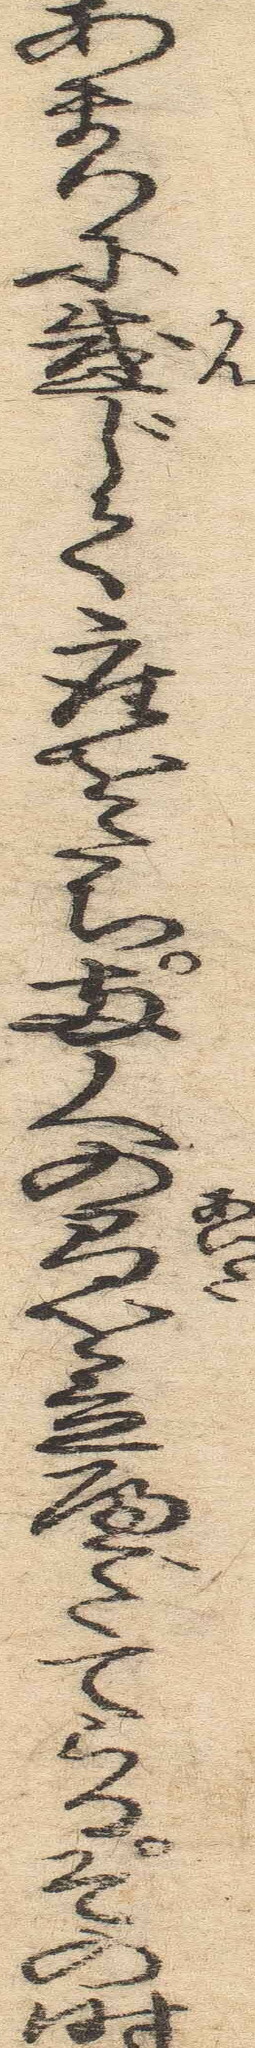あまりに感じて座をたち。両人の。間を立へたてらる。その時
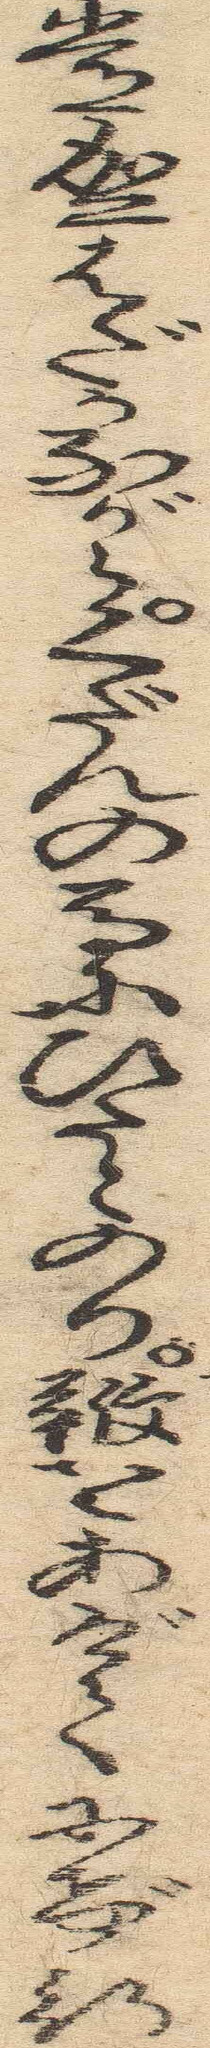常盛はだかながら。くだんの馬にひたとのり。鞭をあげてにげ行
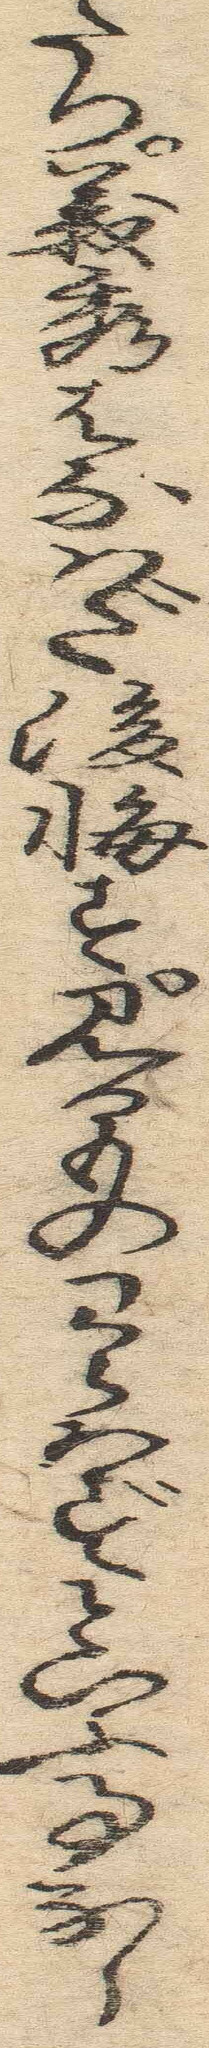たり。義秀はなはだ後悔す。見るものわらはずといふ事なし
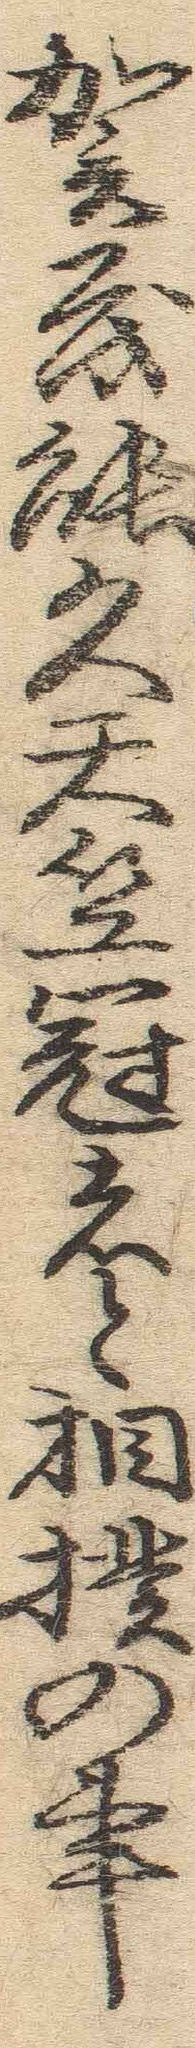賀茂能久天竺冠者相撲の事
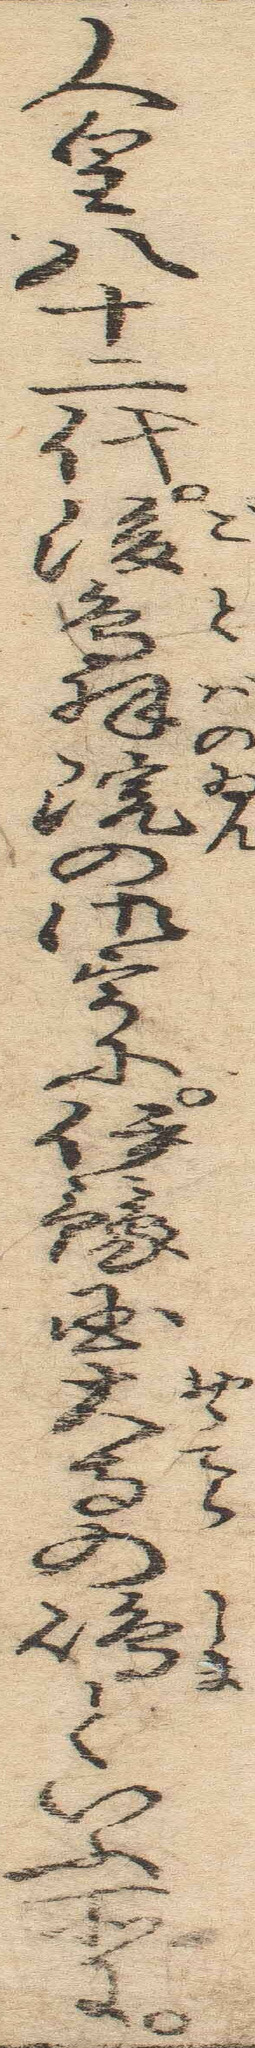人皇八十二代後鳥羽院の御宇に。伊豫国大寺の嶋といふ所に。
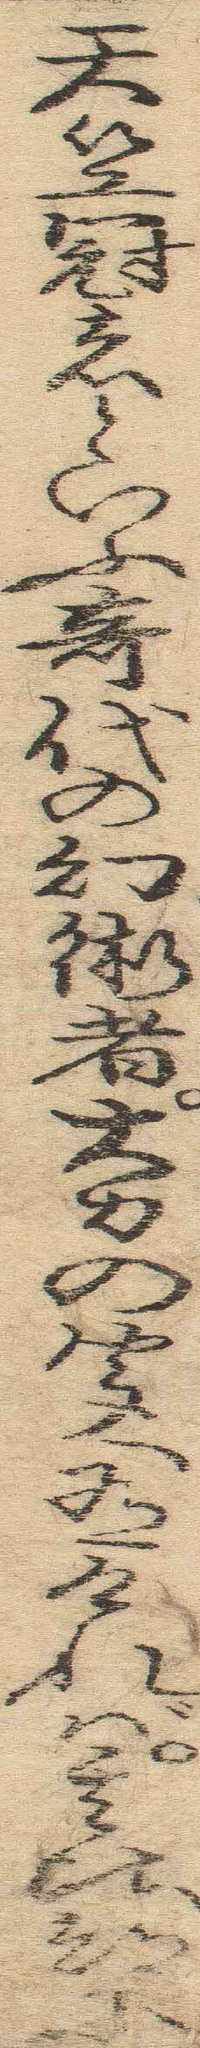天竺冠者といふ希代の幻術者。大力の聞へ有ければ。其比都に
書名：古今相撲大全
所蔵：東京学芸大学附属図書館 国文学研究資料館
